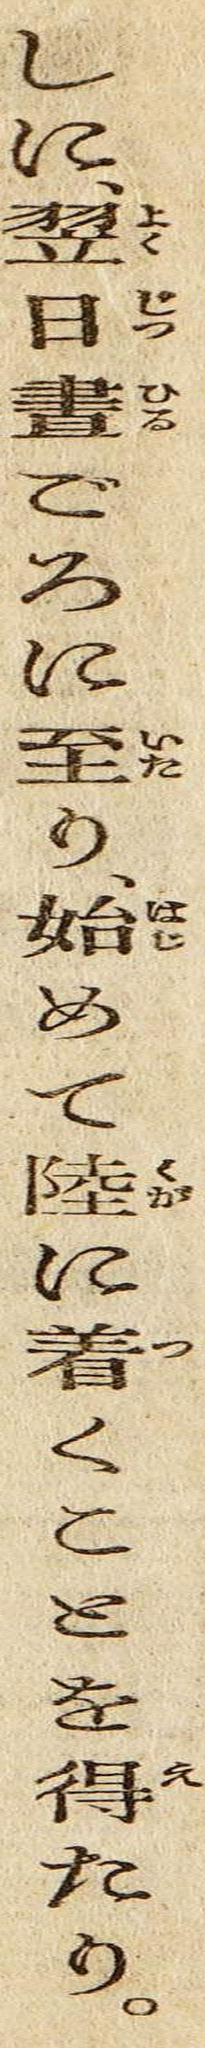しに、翌日昼ごろに至り、始めて陸に着くことを得たり。
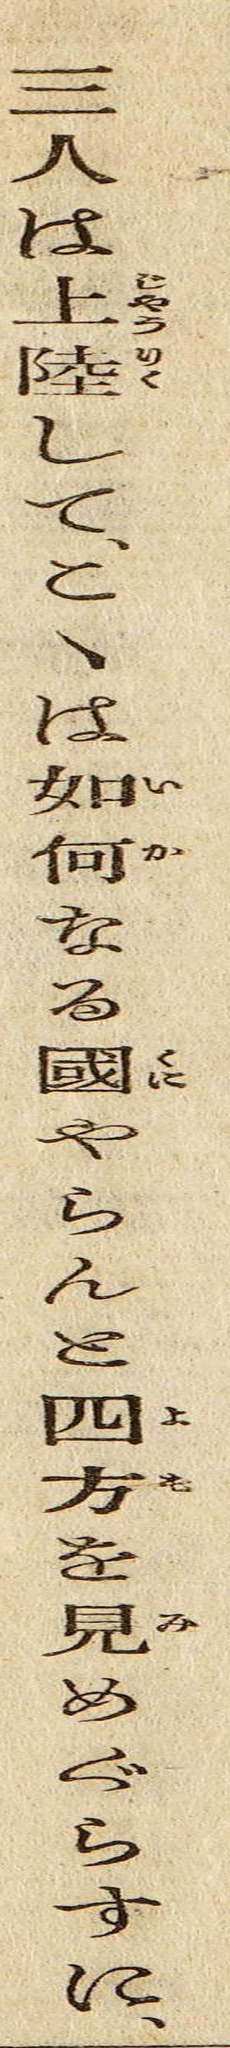三人は上陸して、こヽは如何なる国やらんと四方を見めぐらすに、
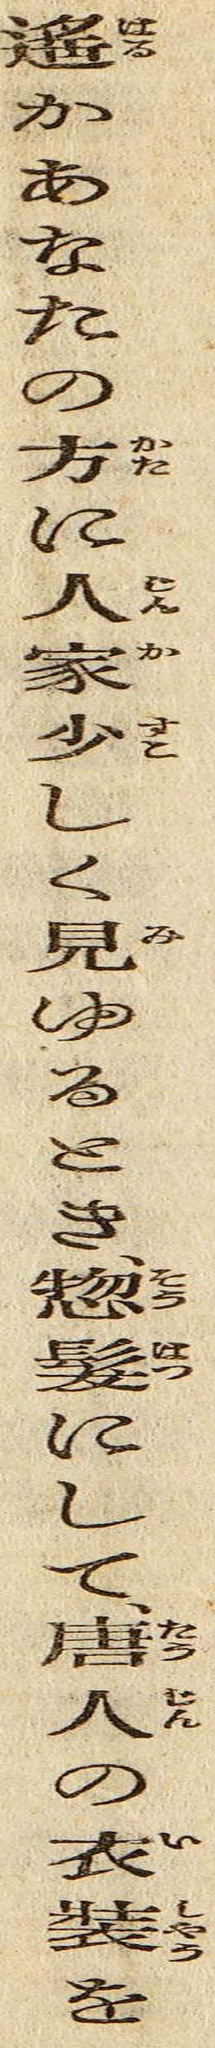遥かあなたの方に人家少しく見ゆるとき、総髪にして、唐人の衣装を
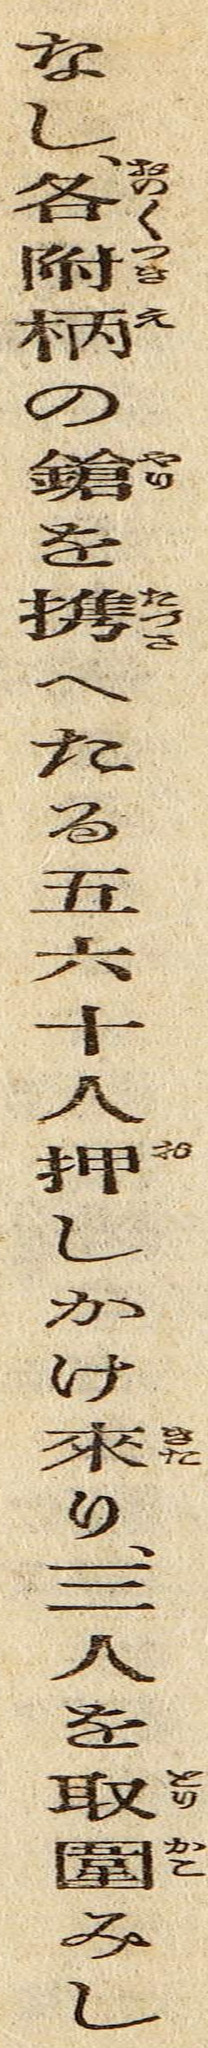なし、各附柄の鎗を携へたる五六十人押しかけ来り、三人を取囲みし
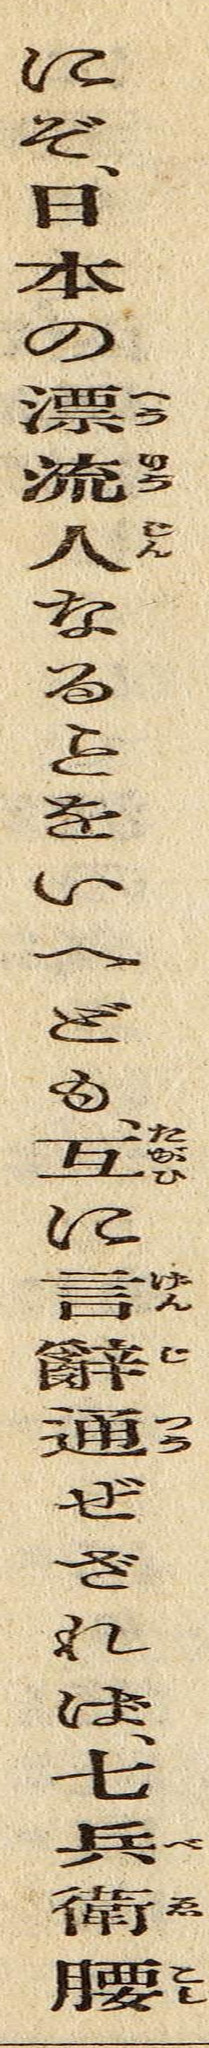にぞ、日本の漂流人なることをいへども、互に言辞通ぜざれば、七兵衛腰
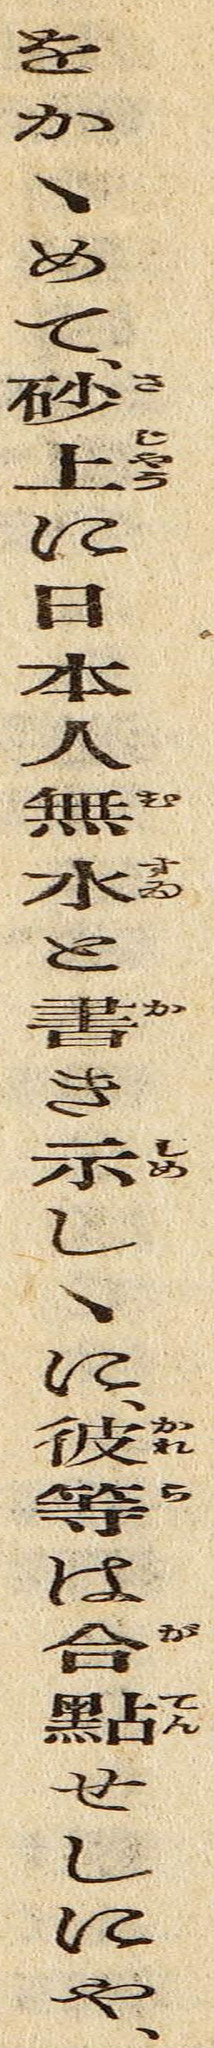をかヽめて、砂上に日本人無水と書き示しヽに、彼等は合点せしにや、
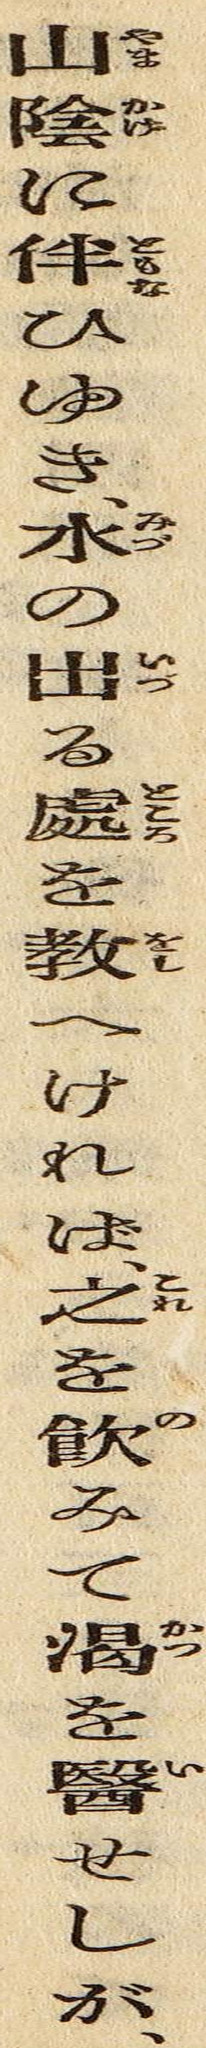山陰に伴ひゆき、水の出る処を教へければ、之を飲みて渇を医せしが、
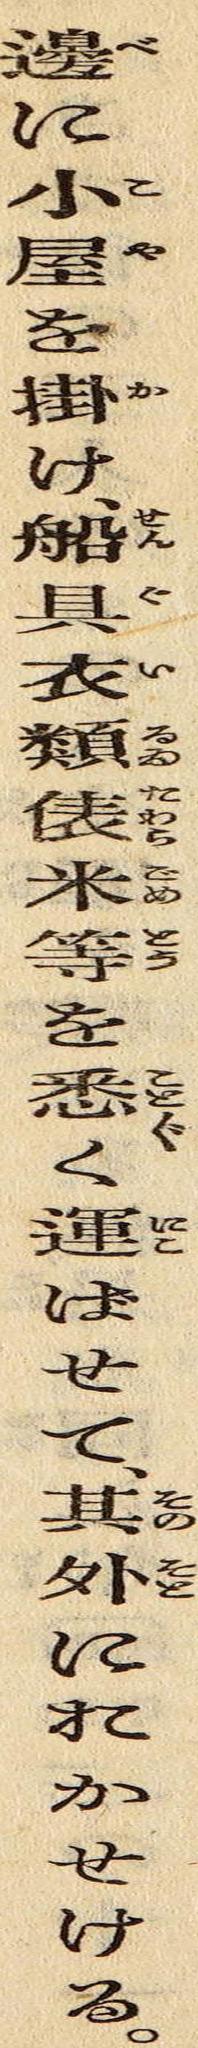辺に小屋を掛け、船具衣類俵米等を悉く運ばせて、其外におかせける。
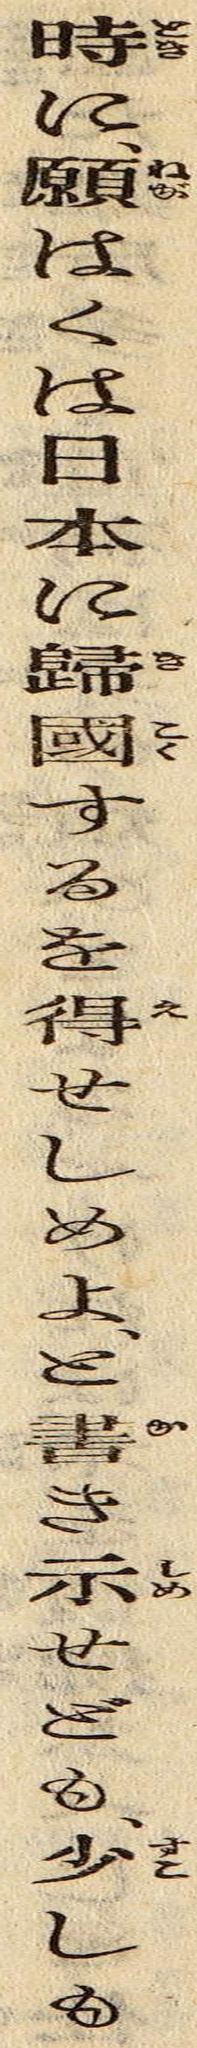時に、願はくは日本に帰国するを得せしめよ、と書き示せども、少しも
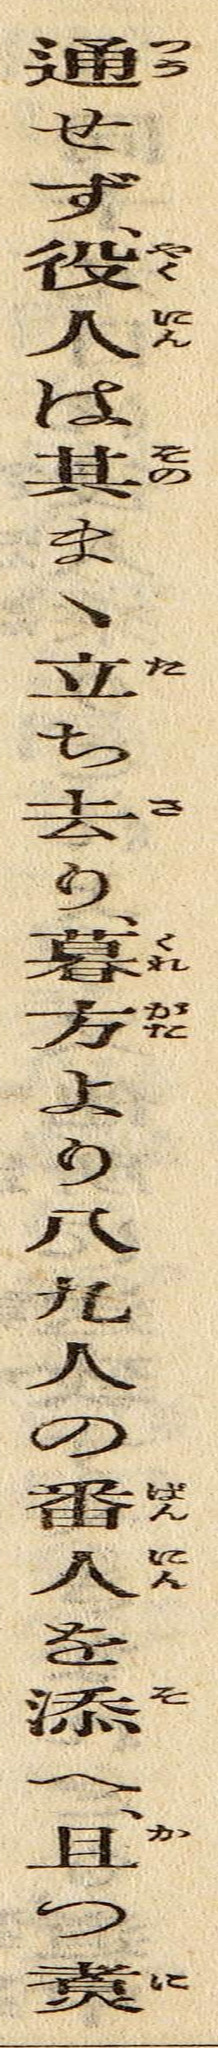通せず、役人は其まヽ立ち去り、暮方より八九人の番人を添へ、且つ煮
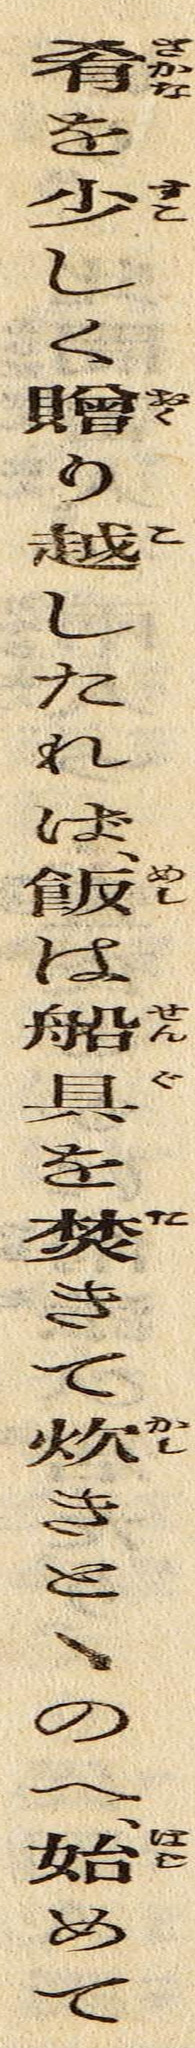肴を少しく贈り越したれば、飯は船具を焚きて炊きとヽのへ、始めて
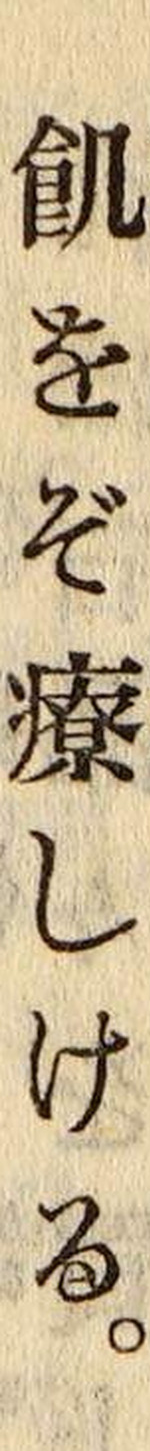飢をぞ療しける。
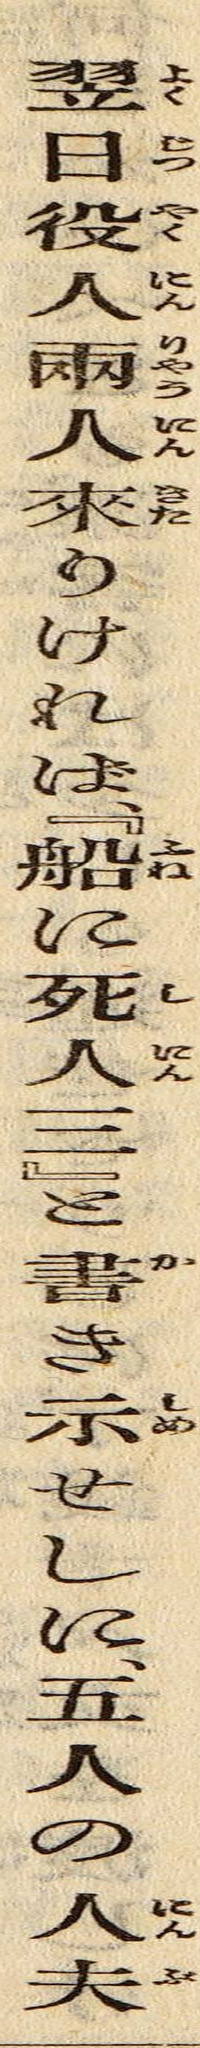翌日役人両人来りければ、『船に死人三』と書き示せしに、五人の人夫
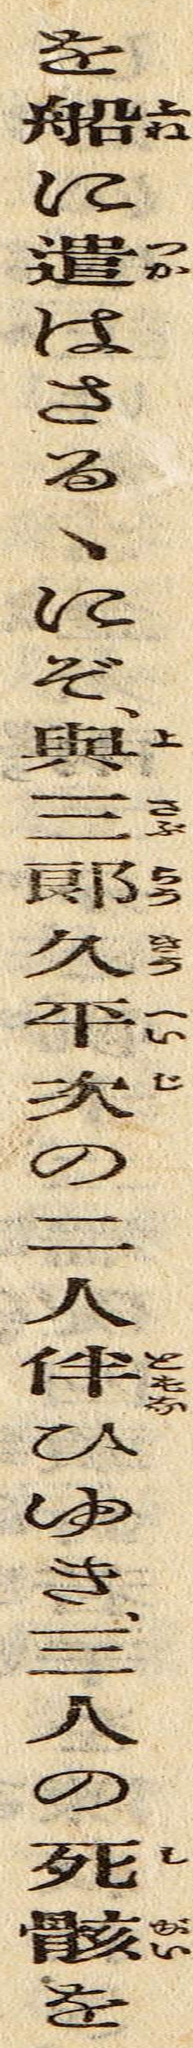を船に遣はさるヽにぞ、与三郎久平次の二人伴ひゆき、三人の死骸を
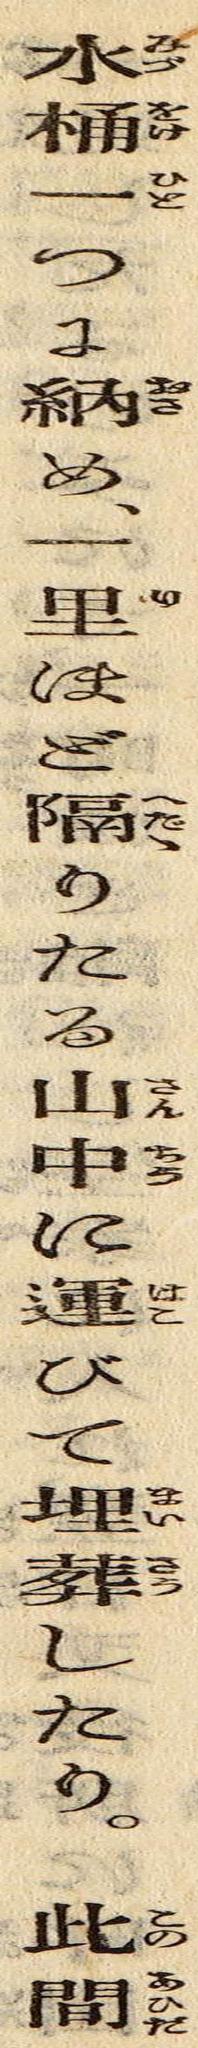水桶一つに納め、一里ほど隔りたる山中に運びて埋葬したり。此間
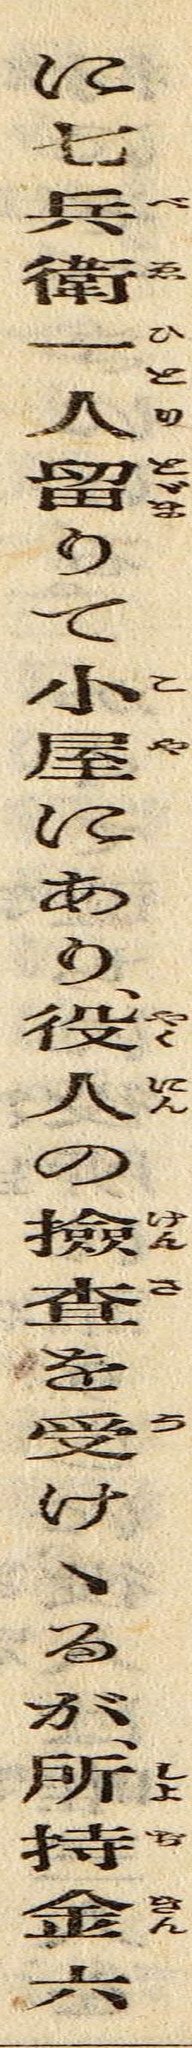に七兵衛一人留りて小屋にあり、役人の検査を受けヽるが、所持金六
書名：日本漂流譚
